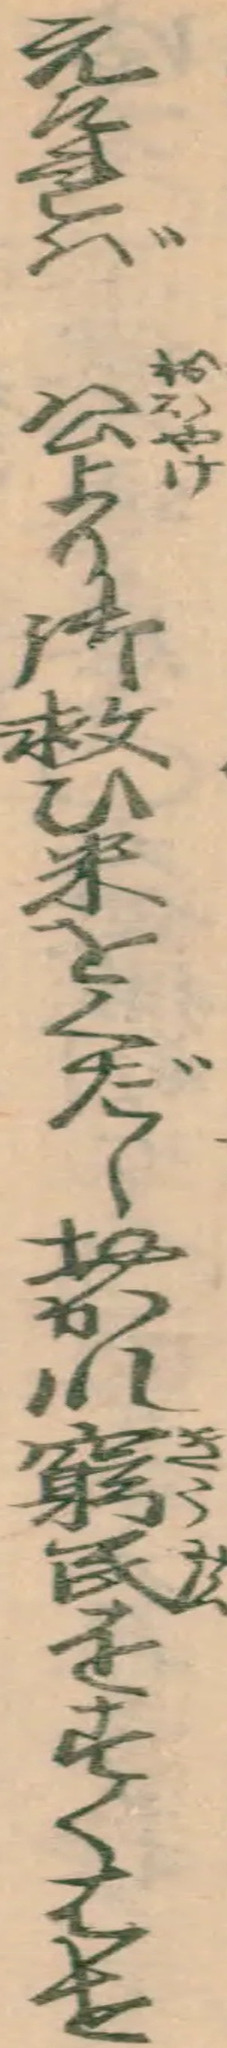えければ公より御救ひ米をくだしおかれ窮民をすくはせ
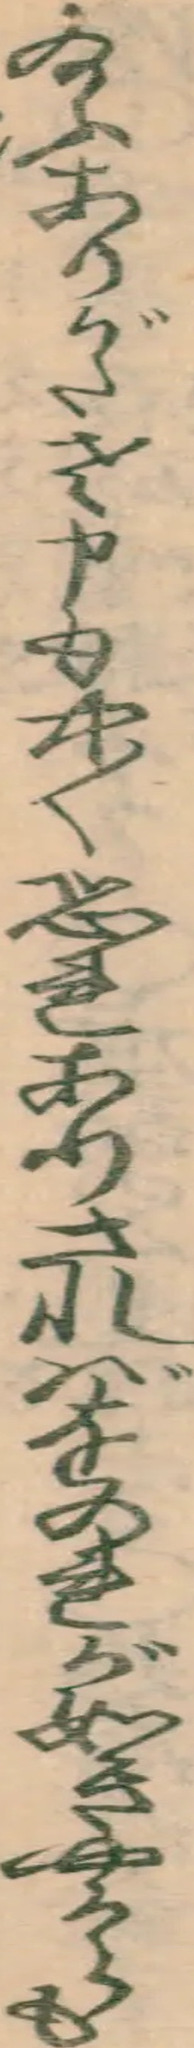給ふありがたさ申も中〳〵恐れありさればをのれが如きやからも
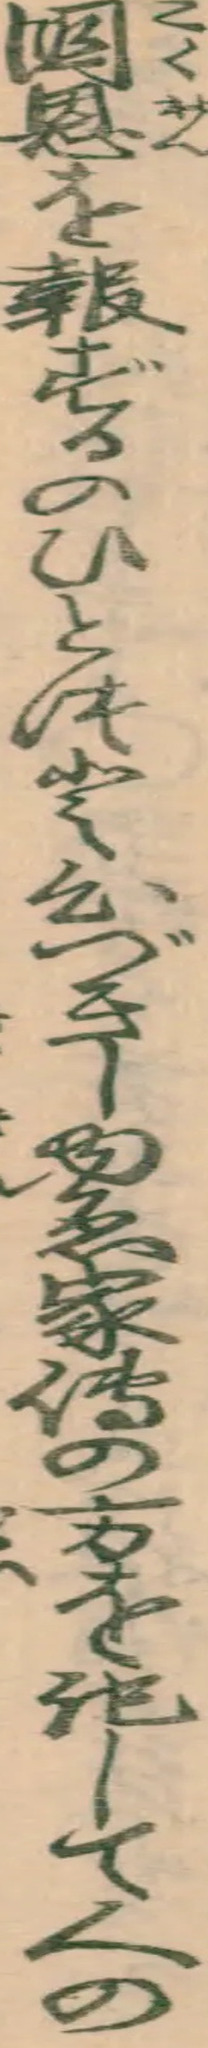国恩を報ずるのひとつと心づきしゆゑ家伝の方を記して人の
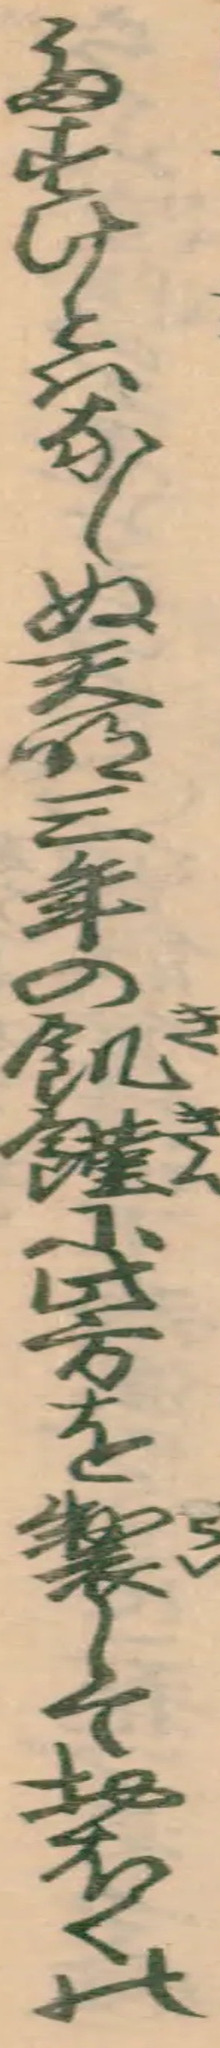たすけとはなしぬ天明三年の飢饉に此方を製しておほくの
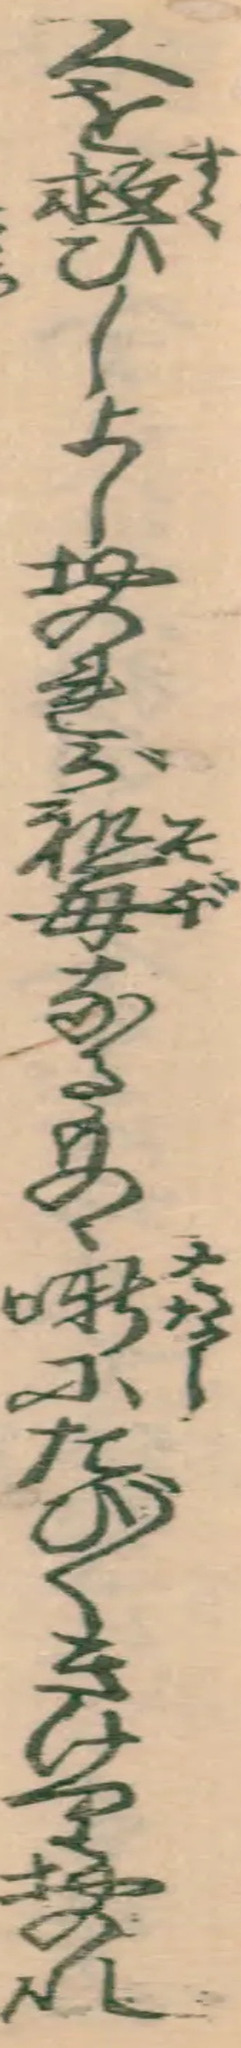人を救ひしよしおのれが祖母なるものゝ噺にたび〳〵きけりおのれ
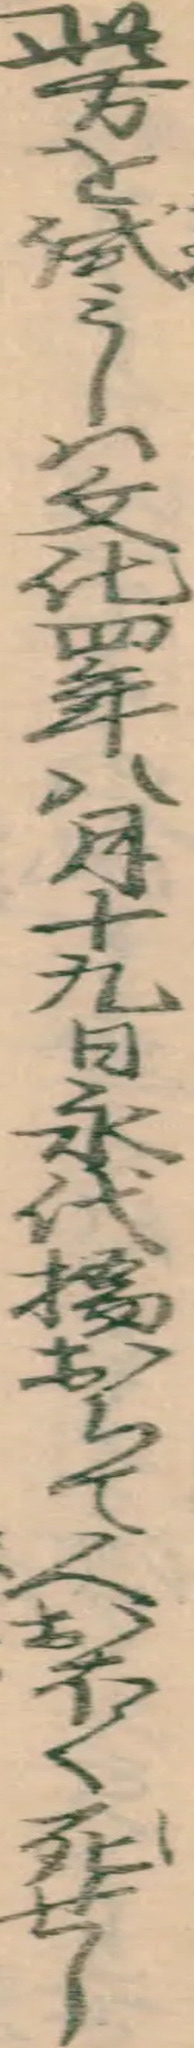此方を試みしは文化四年八月十九日永代橋おちて人おほく死せし
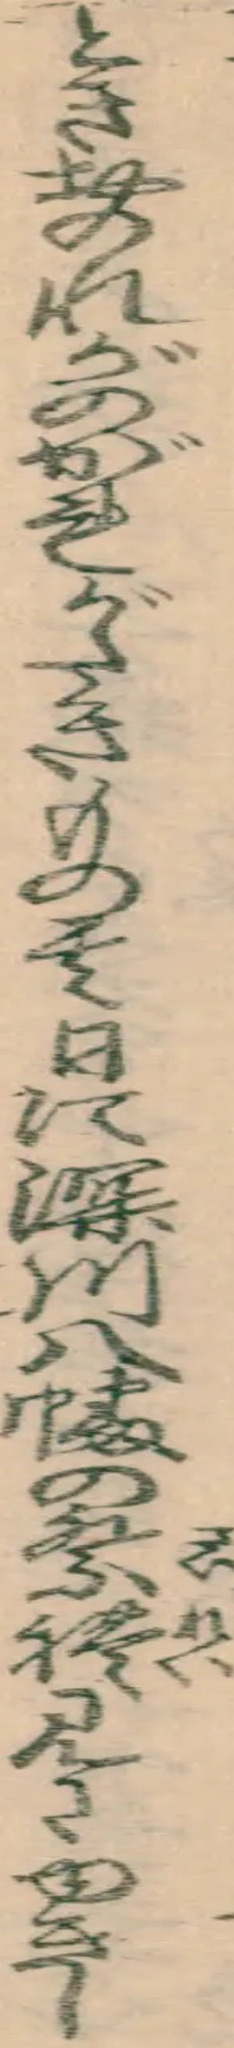ときおのれがのがれがたきもの其日に深川八幡の祭禮見にゆきし
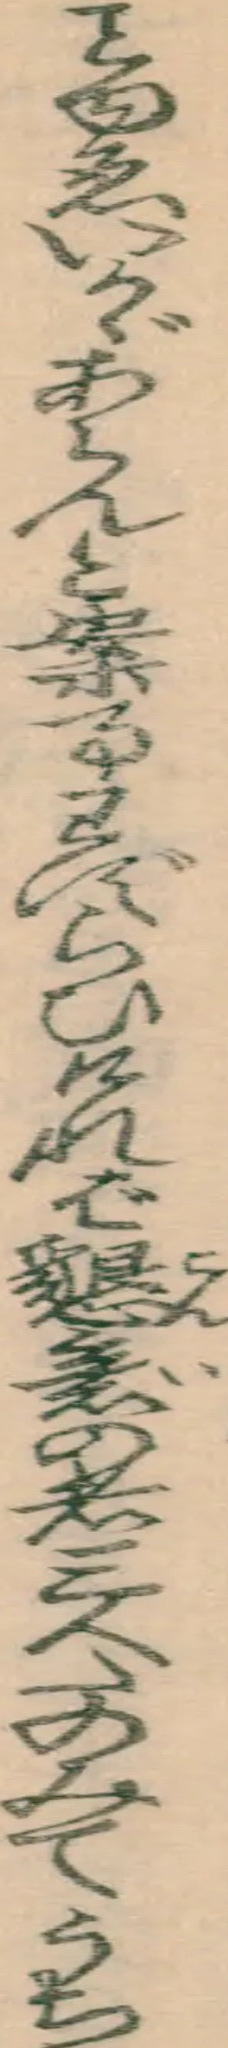ことゆゑいかゞあらんと案事わずらひければ懇意の者三人たのみてうち
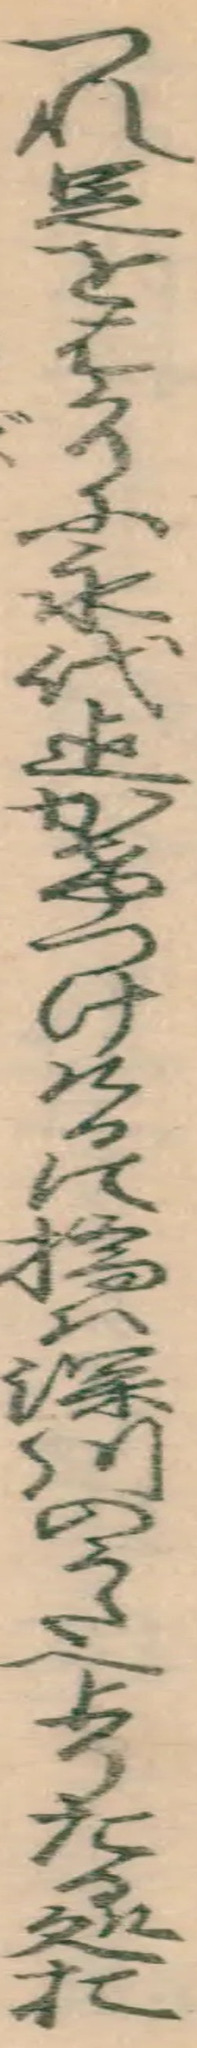つれ是をはかりに永代迄かけつけけるに橋は深川のかたへよりたる処お
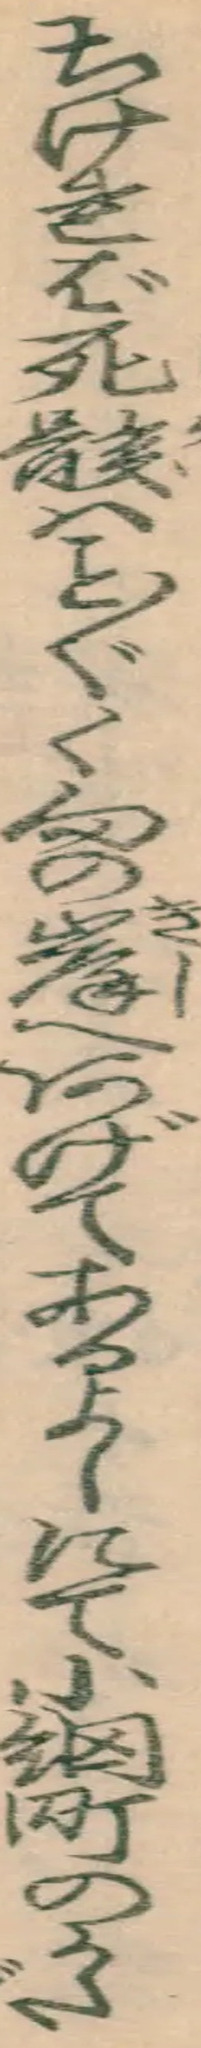ちければ死骸はこと〴〵く向の岸へあげてあるよしにて小網町のかた
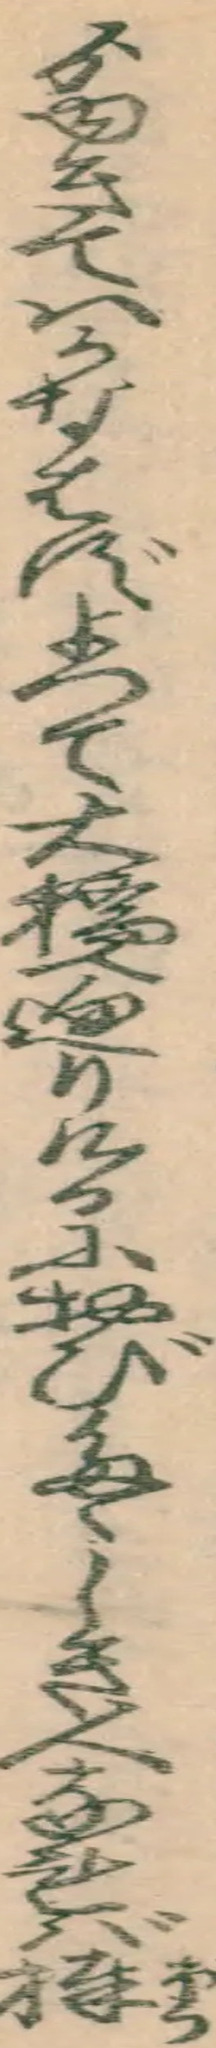よりゆきてはかなはずよつて大橋へ廻りけるにおびたゝしき人なれば棒
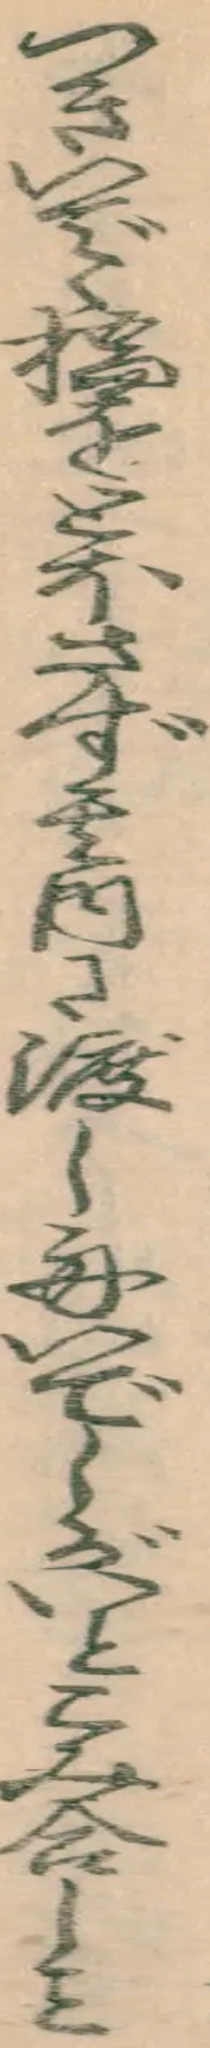つきいでゝ橋をとほさず其内に渡し舟いでしがいとこみ合しこと
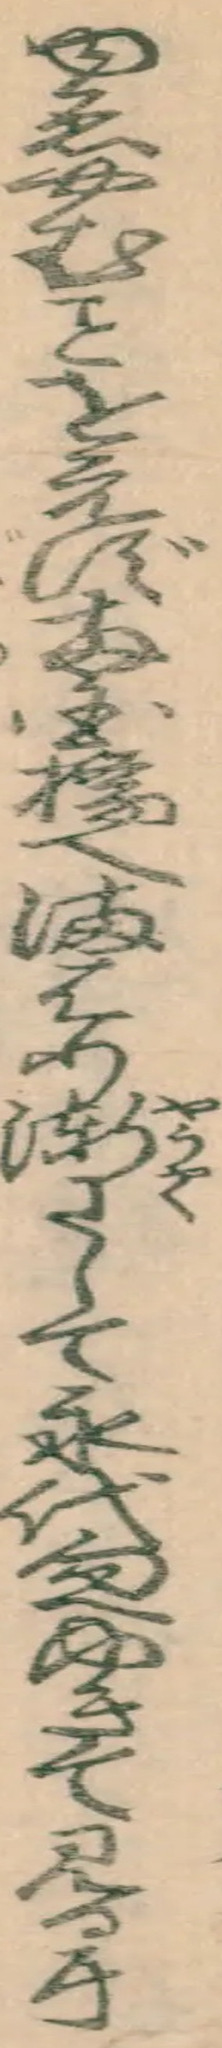ゆゑやむことをえず両国橋へまはり漸にして永代向へゆきて見るに
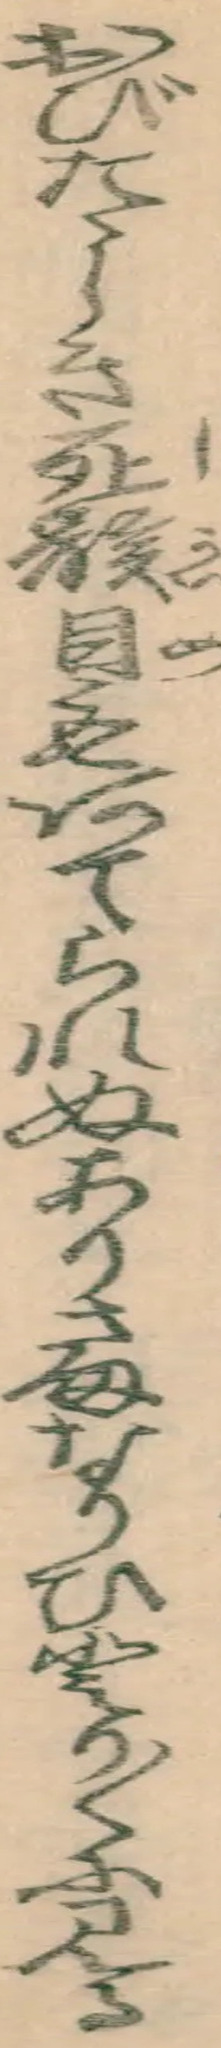おびたゝしき死骸目もあてられぬありさまなりひとり〳〵に見る
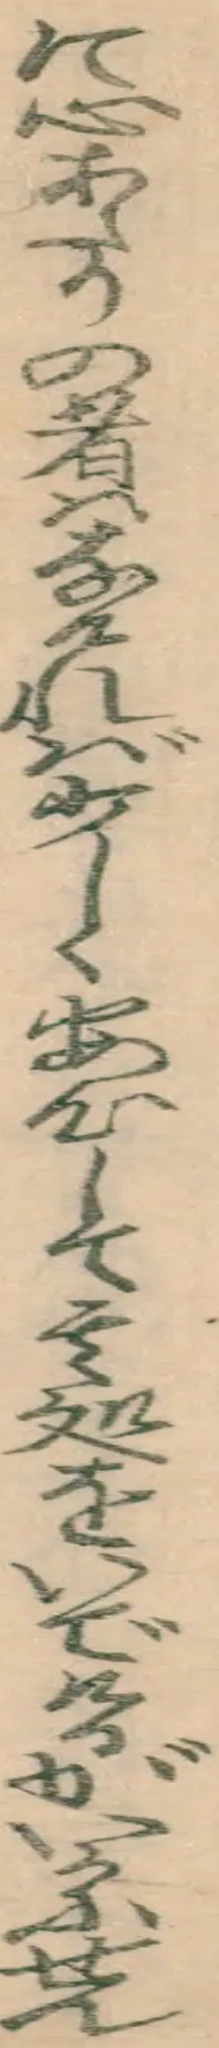に心あたりの者はなければ少しく安心して其処をいでけるがいかにせん
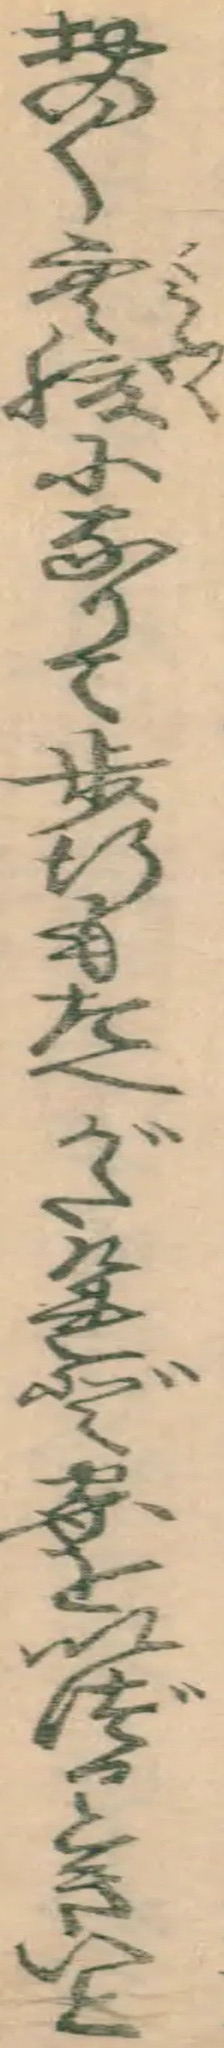おの〳〵空腹になりて歩行もたへがたけれど家をいづるときいと
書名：日ごとの心得
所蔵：国立国会図書館 National Diet Library, JAPAN
